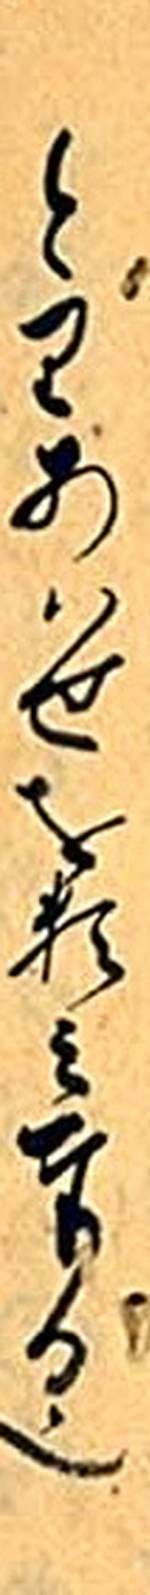とりあはせを頼み奉る也
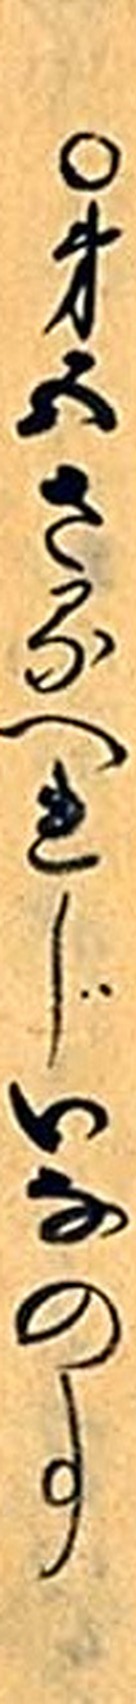○第五さるへれしいなの事

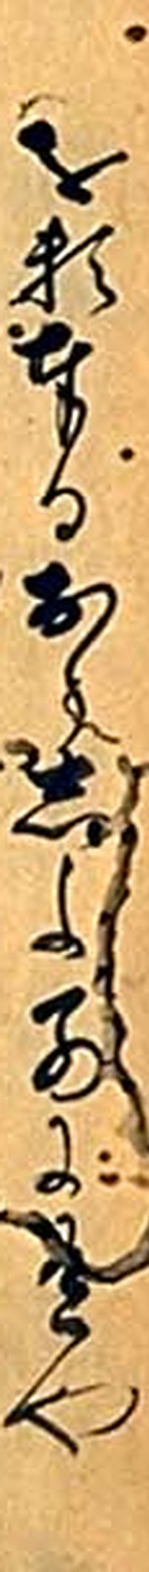を頼奉るおらしよ別に有や
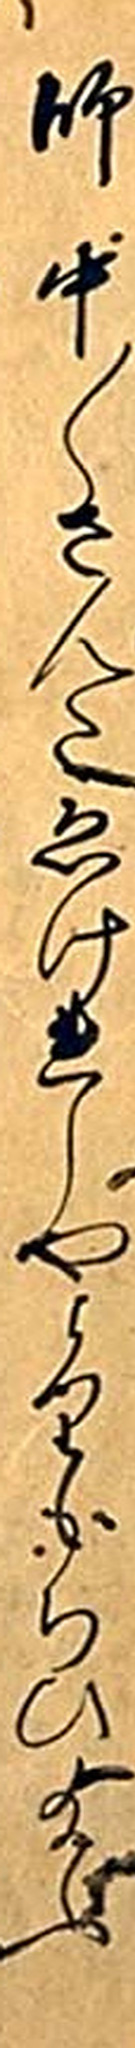師中〳〵さんたゑけれしやよりもちひ給ふ
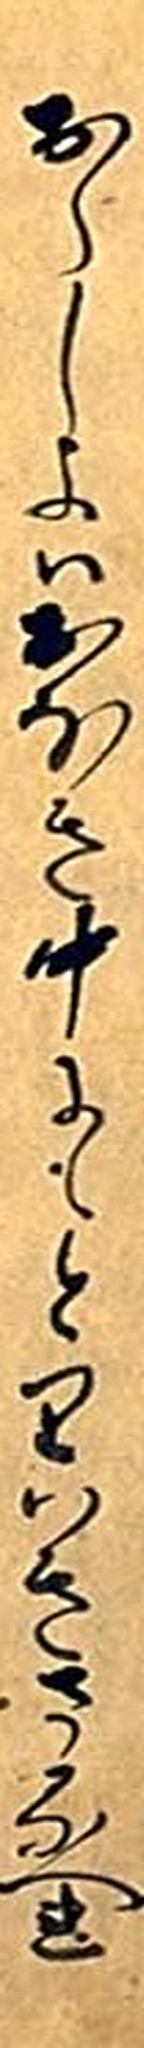おらしよはおほき中にもとりはきさるへれ
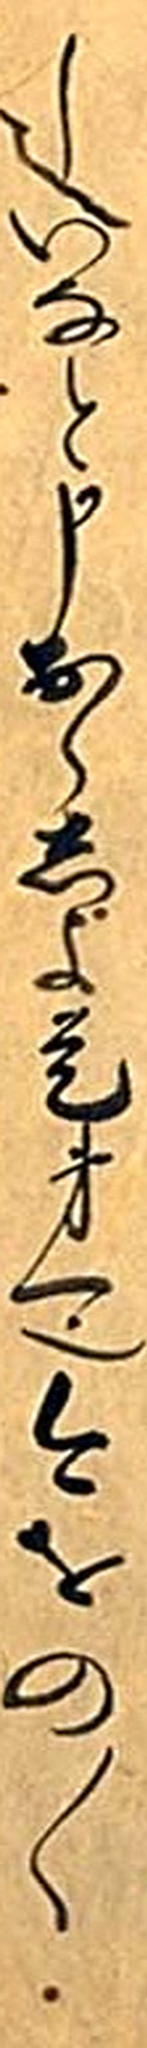しいなと申おらしよ是第一也今をの〳〵
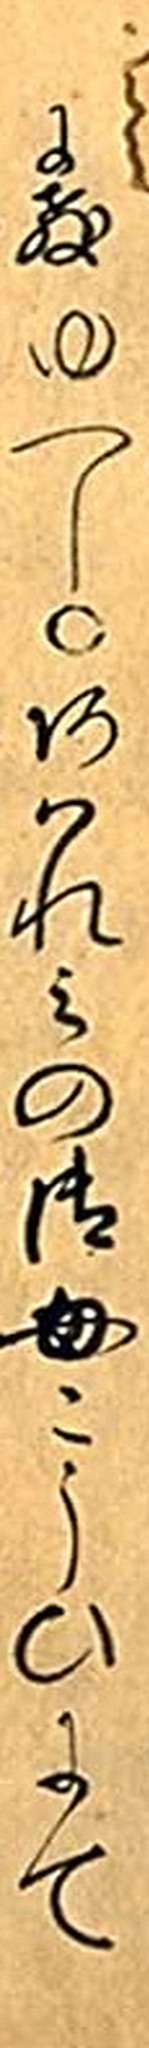に教ゆへし○あはれみの御母こうひにて
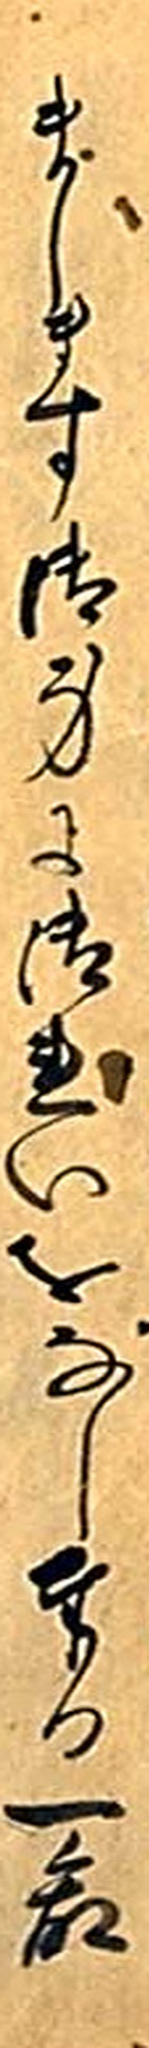まします御身に御れいをなし奉る一命
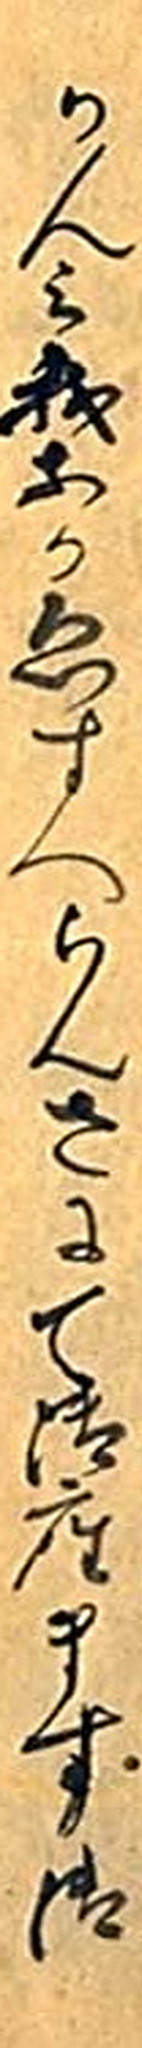かんみ我等かゑすへらんさにて御座ます御
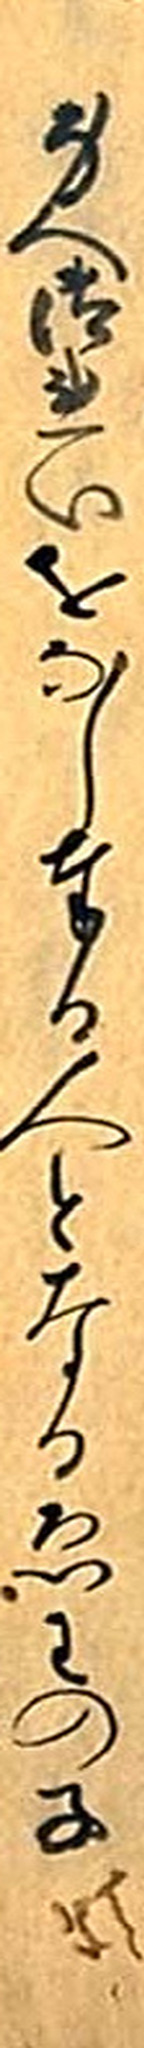身へ御れいをなし奉る人となるゑわの子
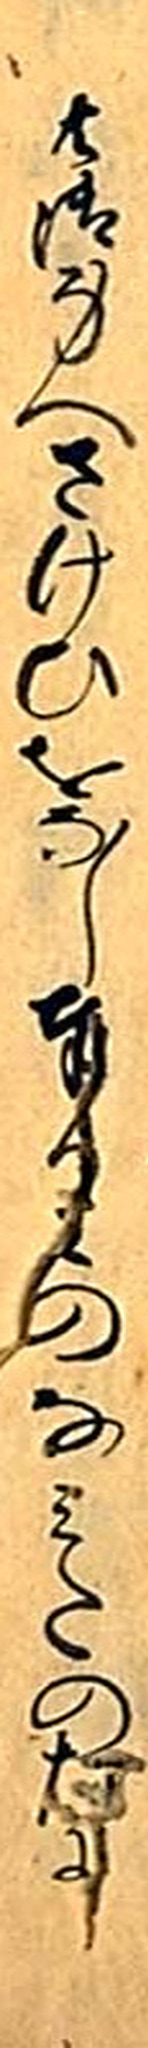共御身へさけひをなし奉るのなみたのたに
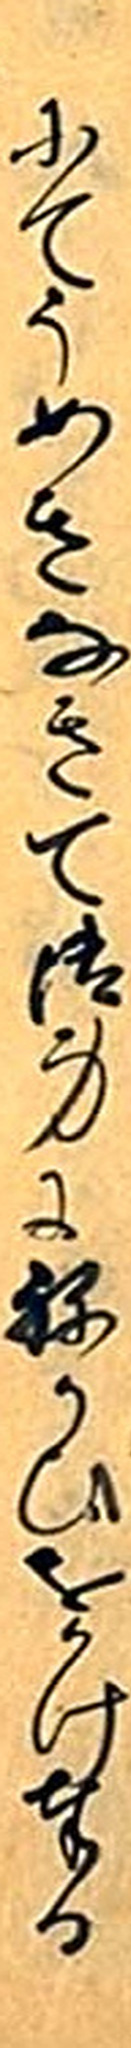にてうめきなきて御身にねかひをかけ奉る
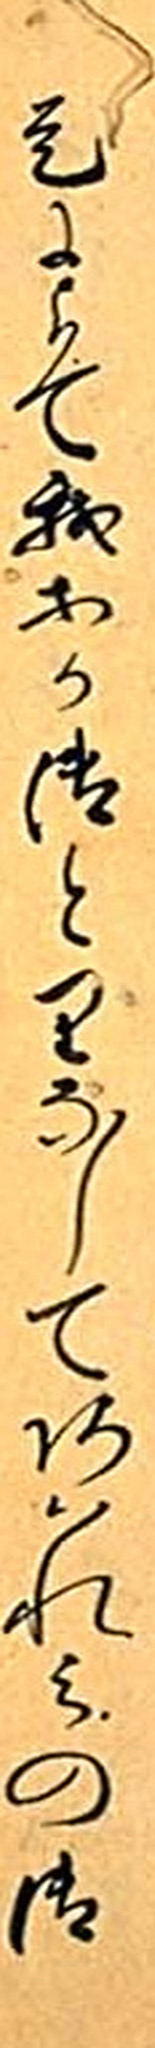是によて我等か御とりなしてあはれみの御
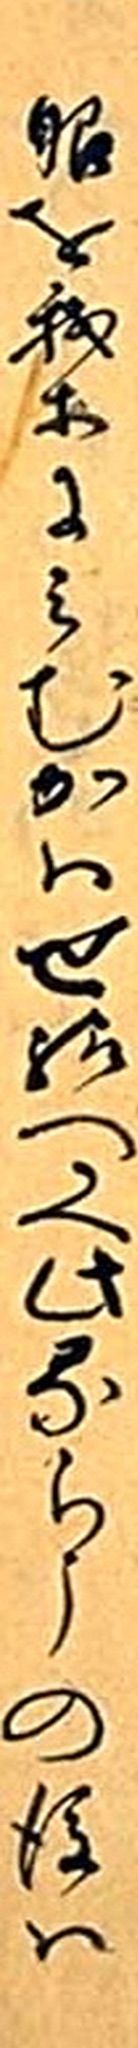眼を我等にみむかはせ給へ又此るらうの後は
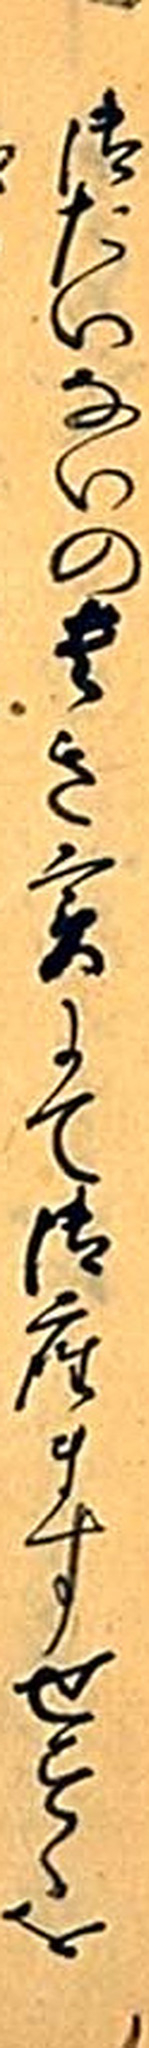御たいないの貴き実にて御座ますせすゝを
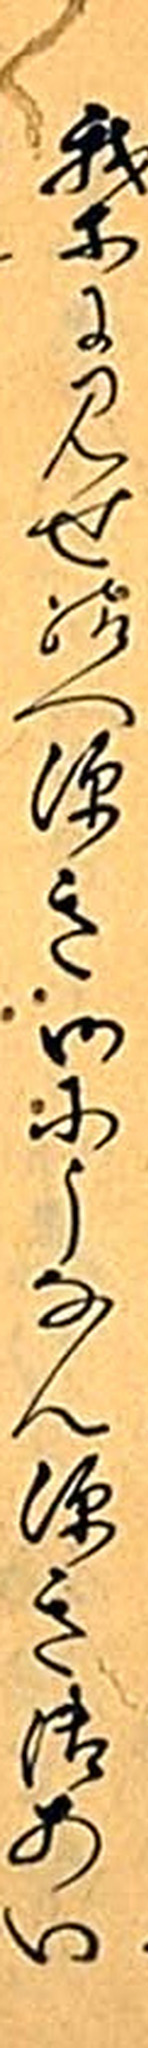我等に見せ給へ深き御にうなん深き御あい
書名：ドチリナ・キリシタン
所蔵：東京大学総合図書館 / General Library in the University of Tokyo
